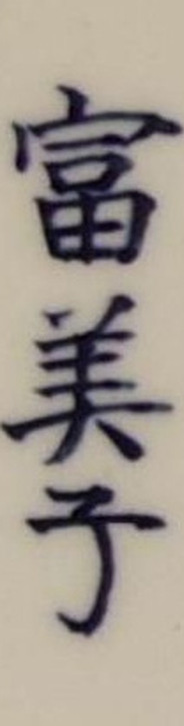富美子
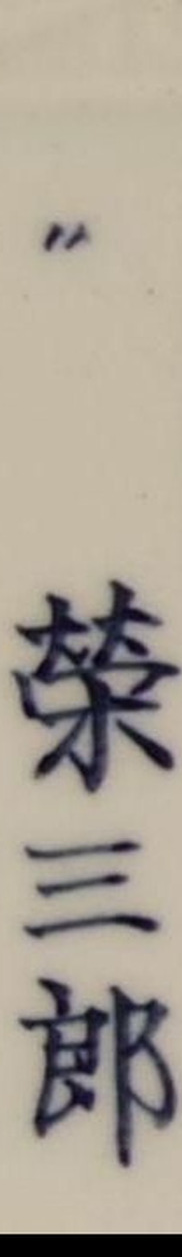榮三郎
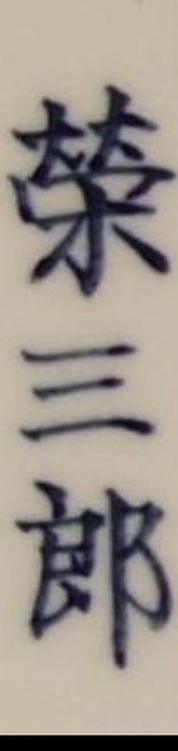榮三郎
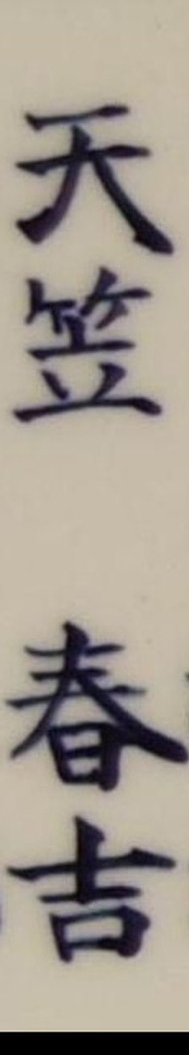天竺春吉
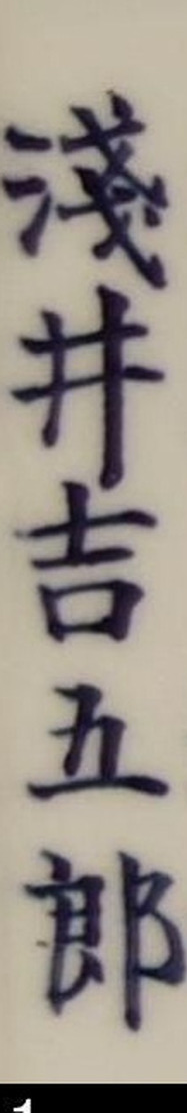浅井吉五郎

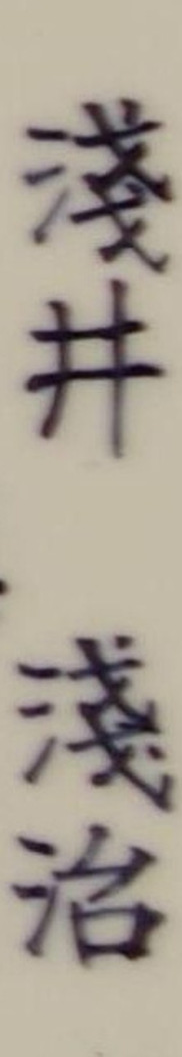浅井浅治
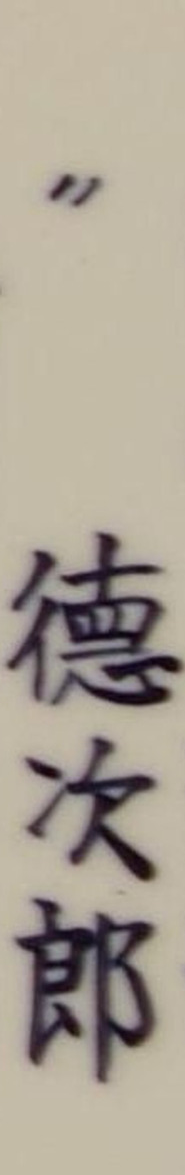徳次郎
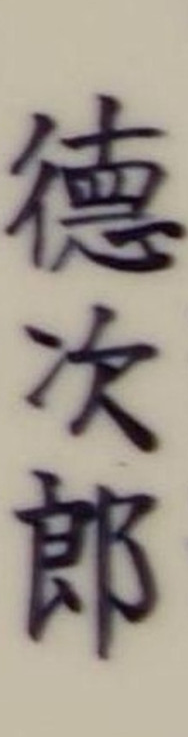徳次郎
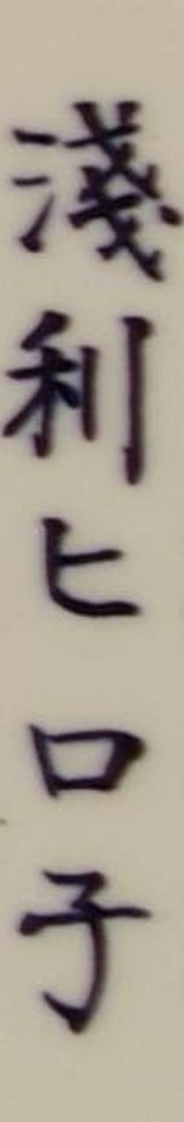浅利ヒロ子
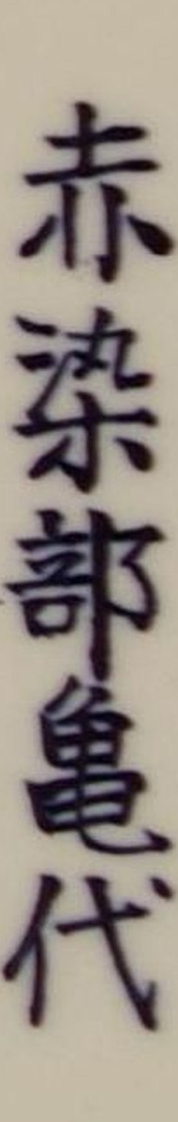赤染部亀代
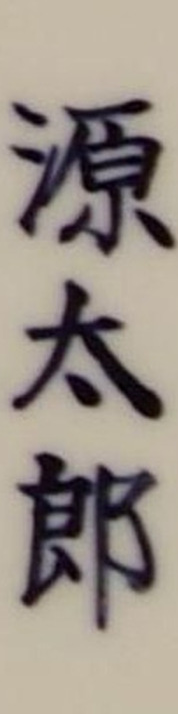源太郎
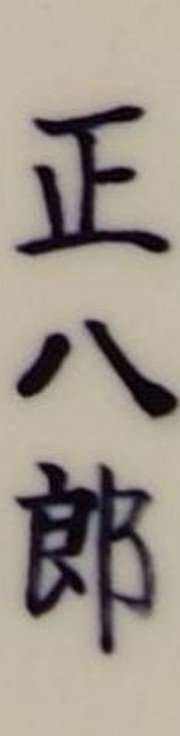正八郎
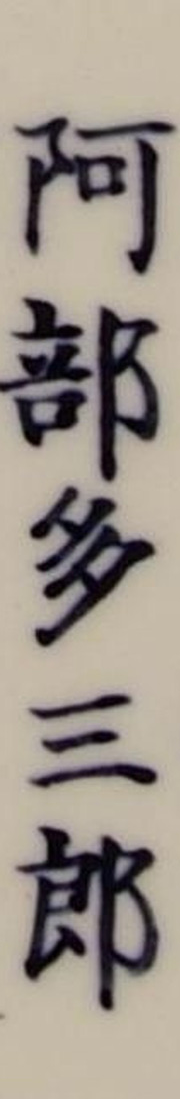阿部多三郎
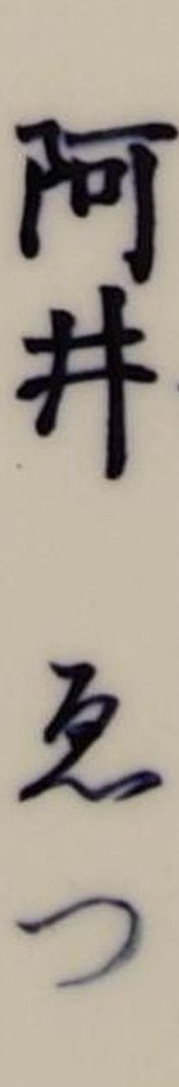阿井えつ
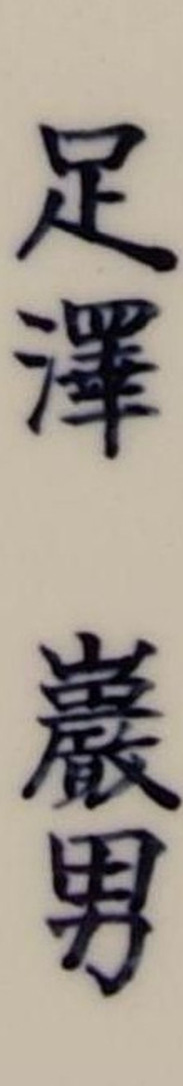足澤巌男
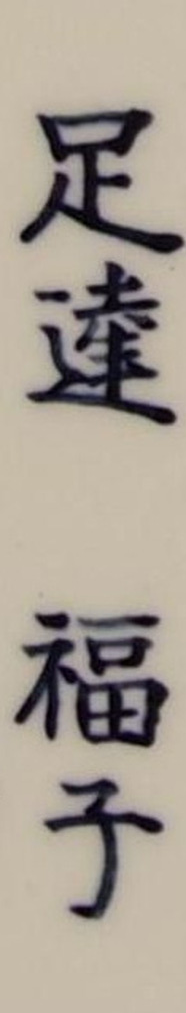足達福子
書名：E~L
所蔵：高野山金剛峯寺
